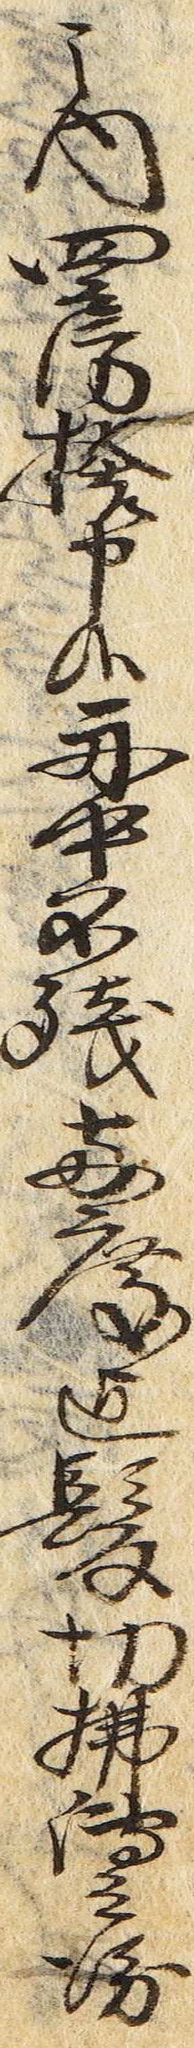之内四房捨申候舟中不残両度迄髪切払伝兵衛
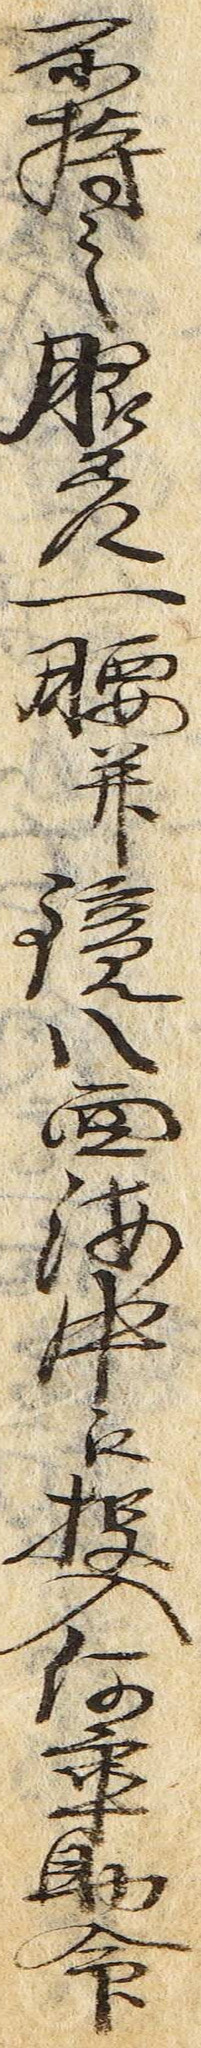所持之脇差一腰幷鏡八面海中江投入何卒助命
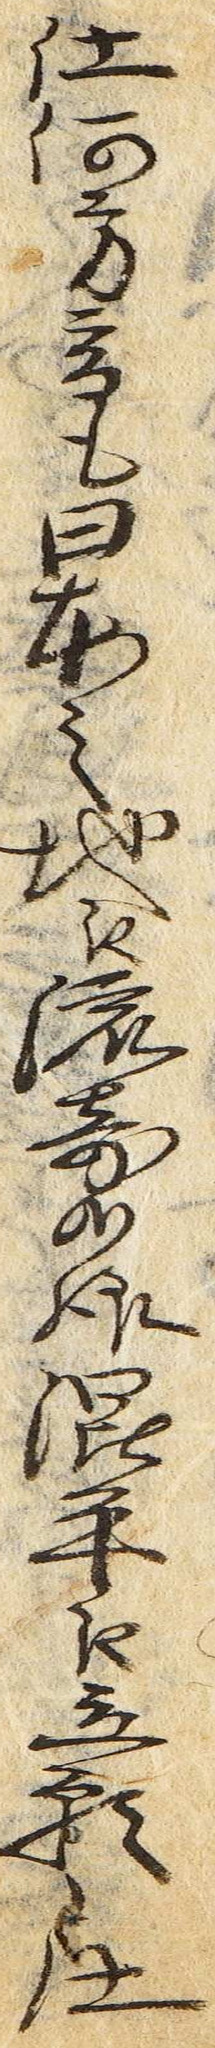仕何方ニ而も日本之地江流寄候様混平江立願仕
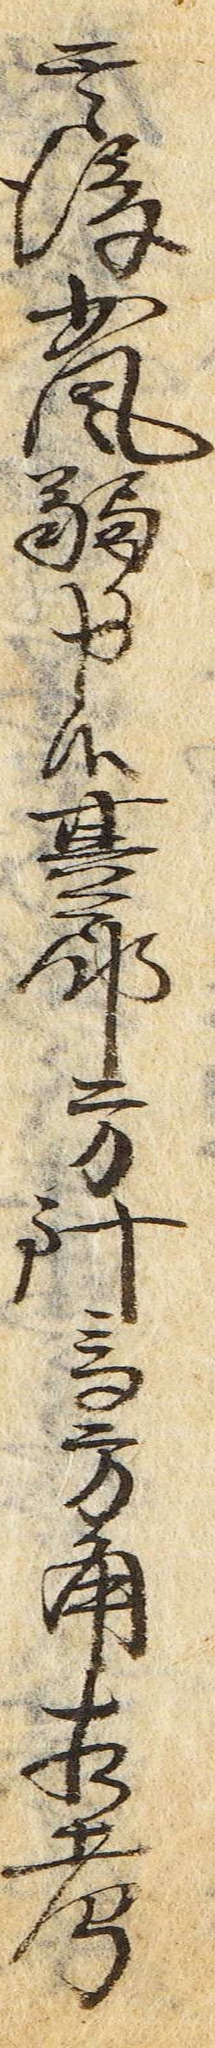其後少風弱り申候其節方針ニ而方角相考
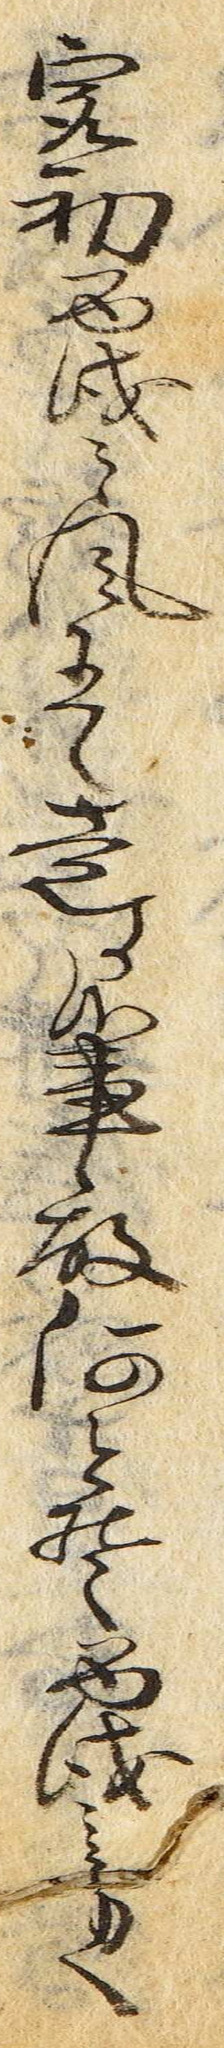最初酉戌之風にて走り候事故何とそ酉戌之方へ
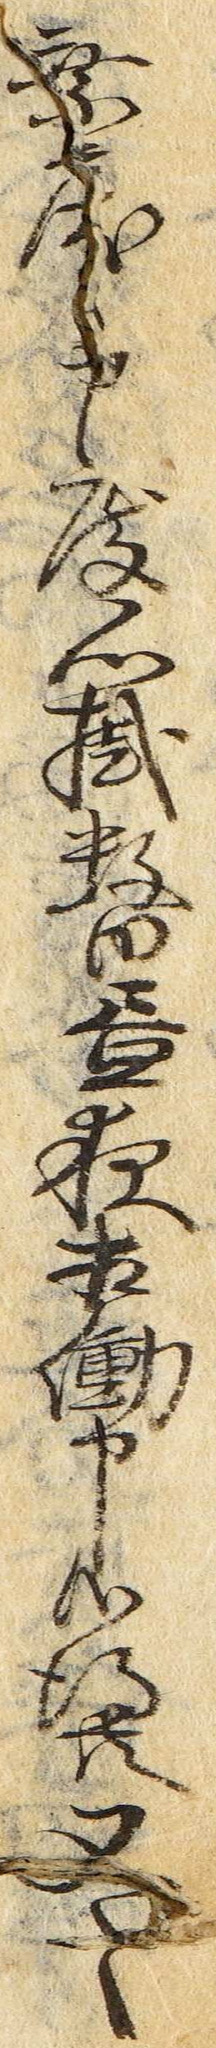乗戻申度心掛数日昼夜相働申候得共又々
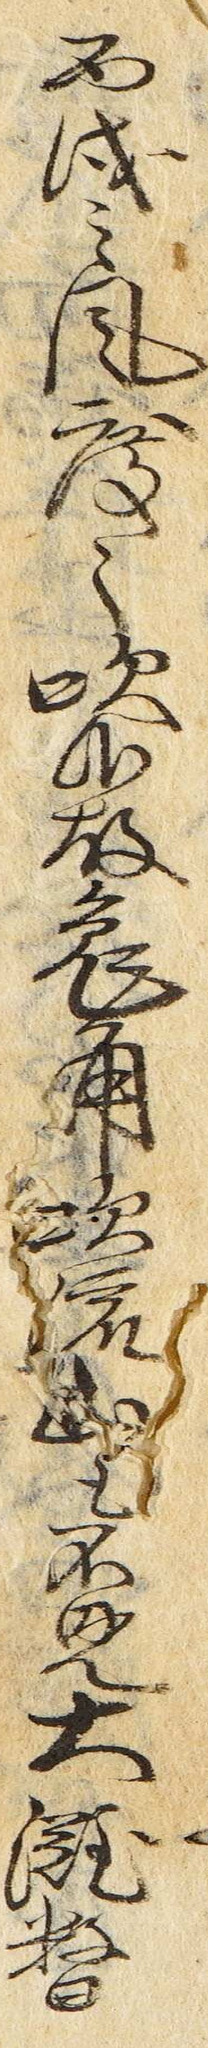酉戌之風度々吹候故兎角吹流山も不見大灘数日

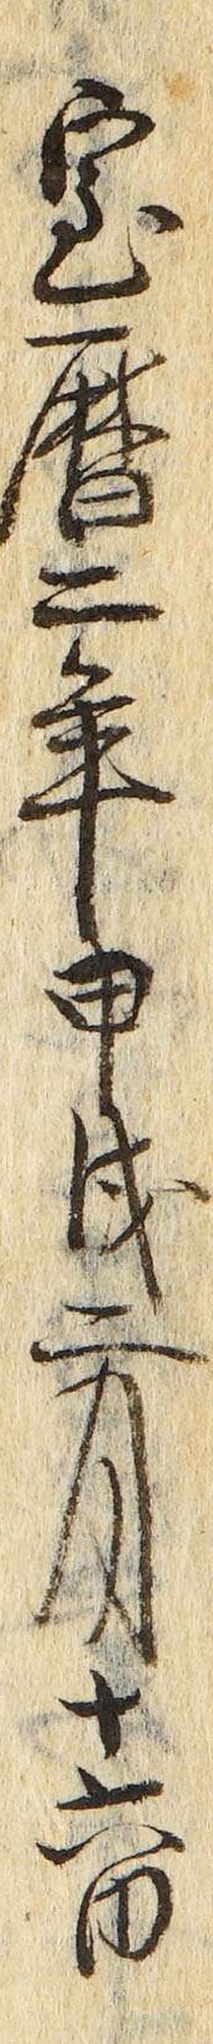宝暦二年甲戌二月十六日
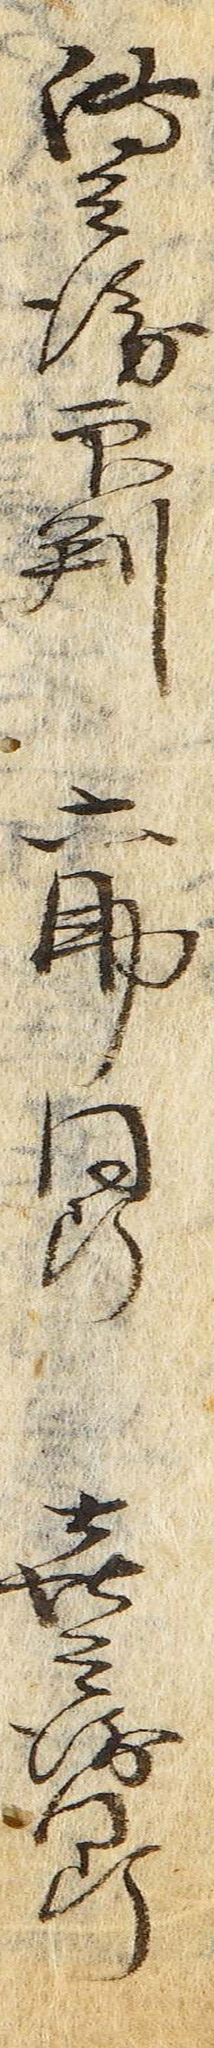伝兵衛印判六助同断喜兵衛同断
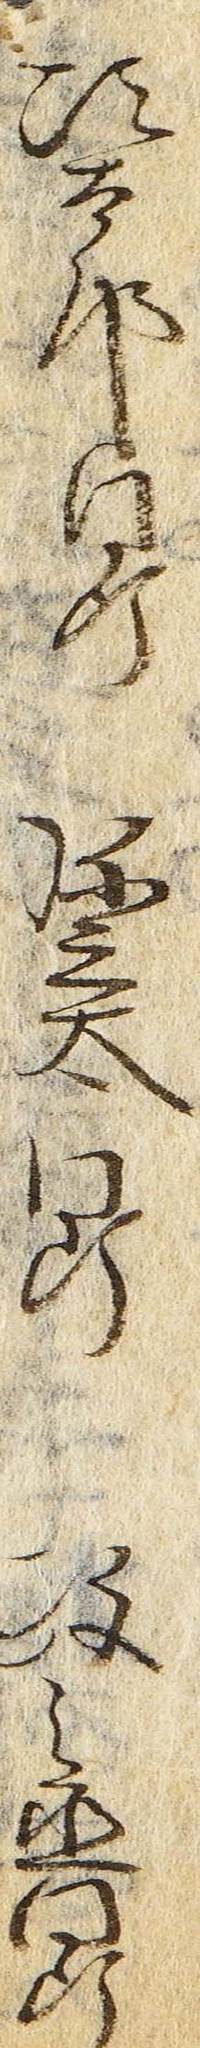次太郎同断弥三太同断政之丞同断
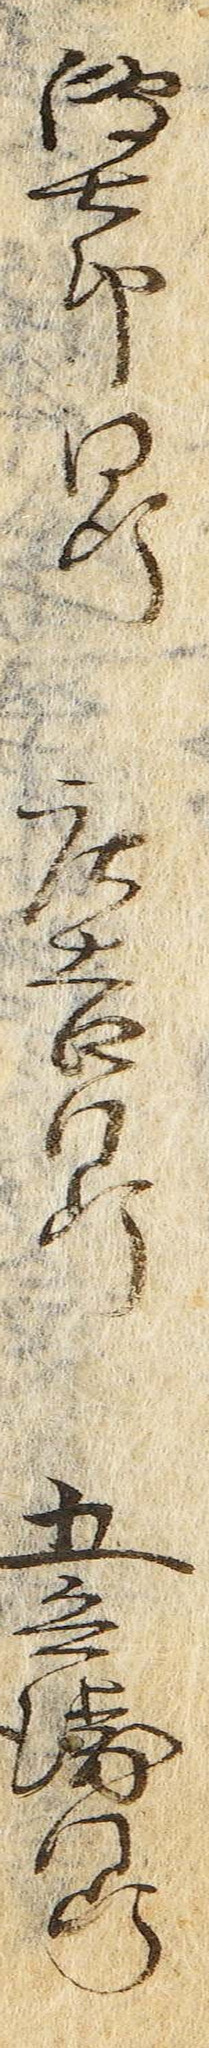伝七郎同断庄吉同断五兵衛同断
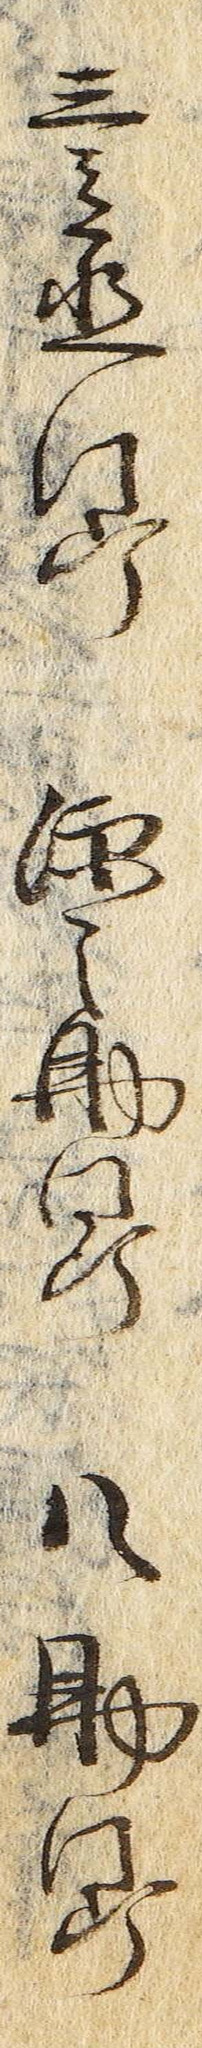三之丞同断源之助同断八助同断
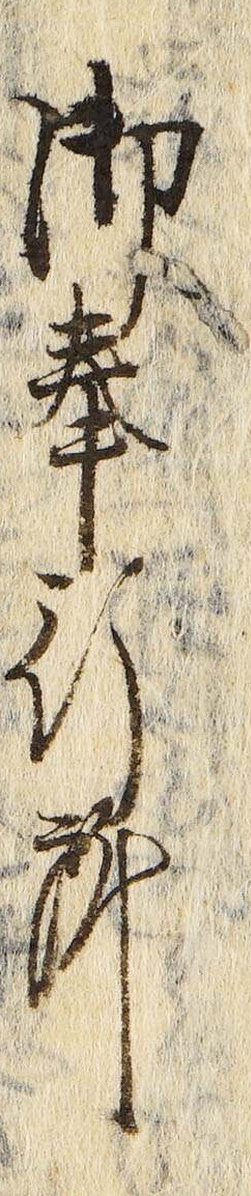御奉行所
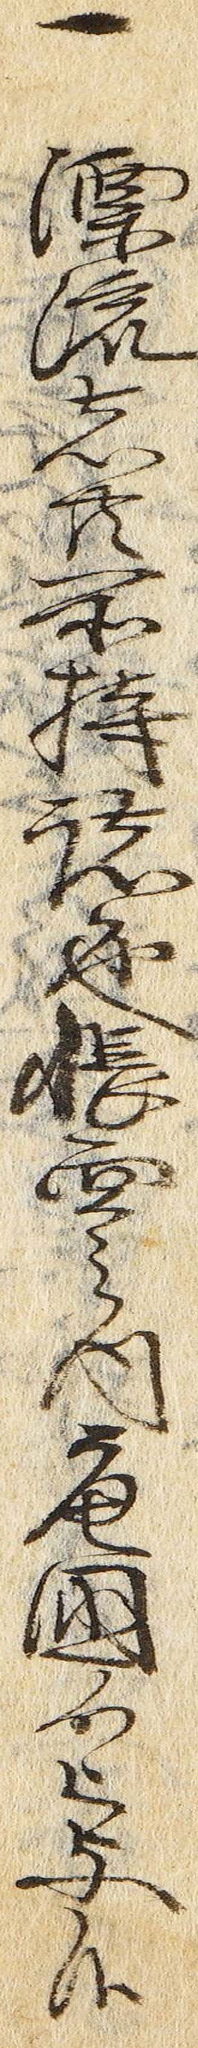一漂流者共所持諸色帳面之内唐国ゟ被与候
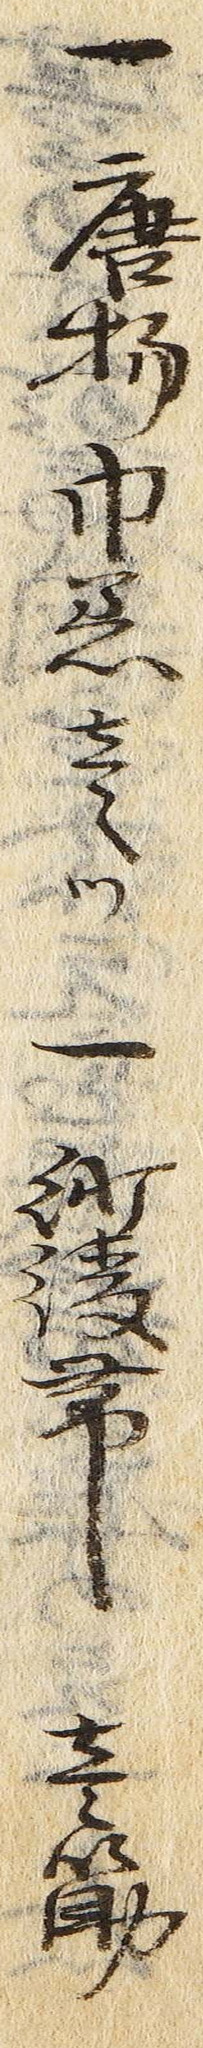一唐物巾着壱ツ一紗綾帯壱筋
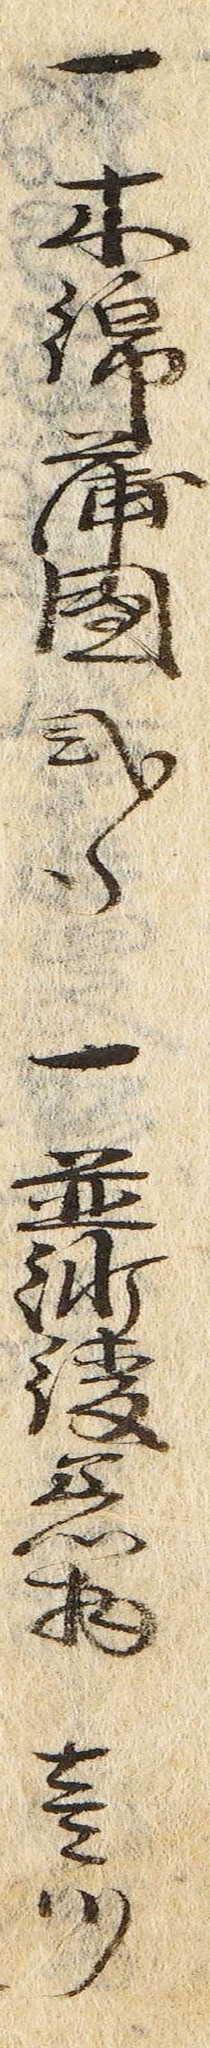一木綿蒲団弐ツ一並紗綾着物壱ツ
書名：奥州仙台領之者唐国江漂流一件
